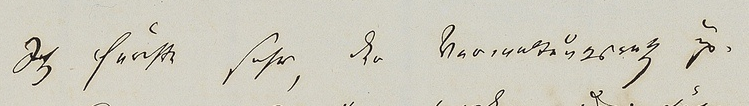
Ich fürchte sehr, der Verwaltungsrath &.
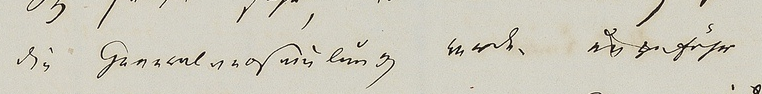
die Generalversammlung werden ungefähr
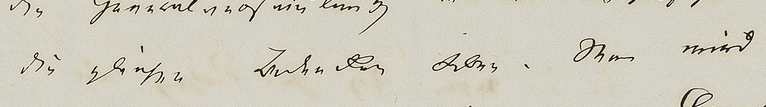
die gleichen Bedenken haben. Man wird
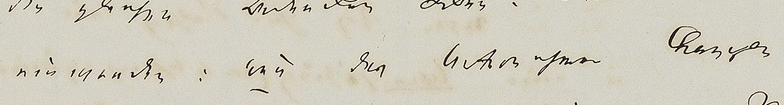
einwenden: wenn das Unternehmen Chancen
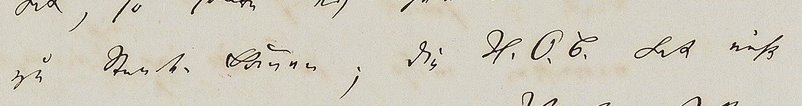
zu Stande kommen; die N.O.B. hat nicht
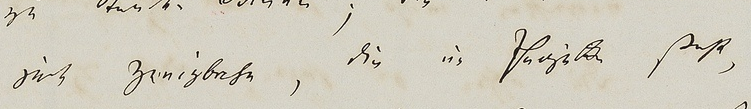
jede Zweigbahn, die im Projekte steht,
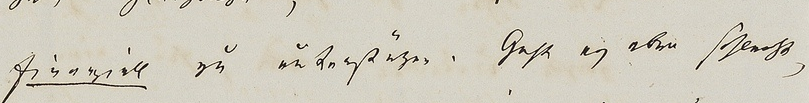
finanziell zu unterstüzen. Geht es aber schlecht,
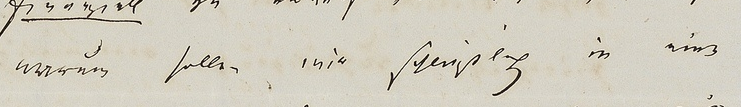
warum sollen wir schließlich in eine
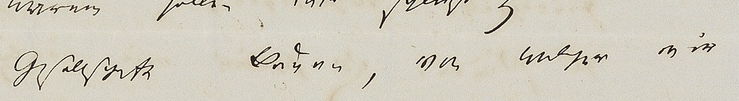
Gesellschaft kommen, von welcher wir
